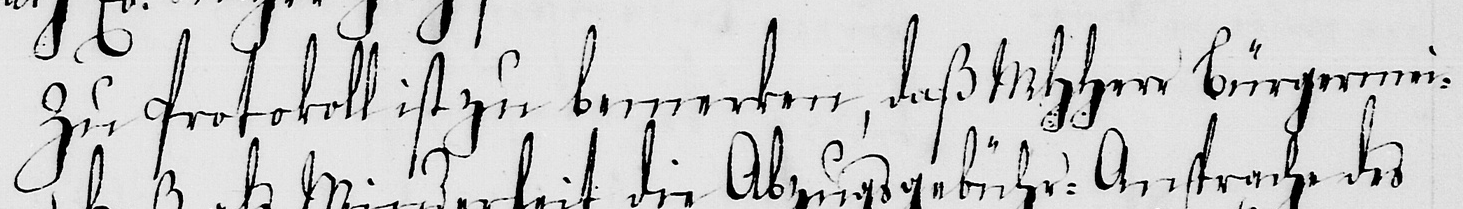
Zu Protokoll ist zu bemerken, daß MHHerr Bürgermei¬
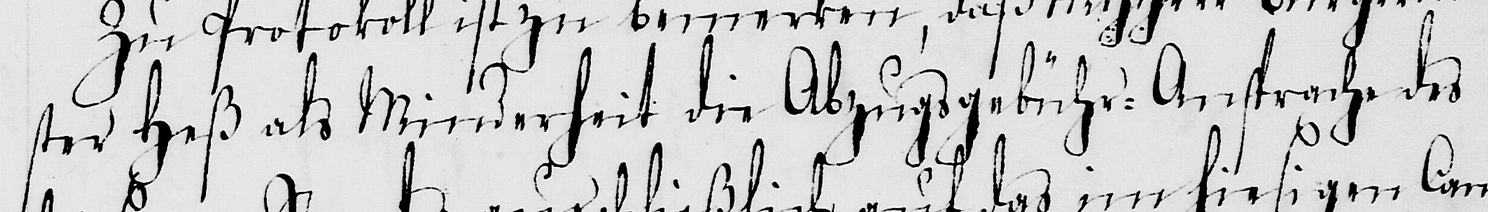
ster Heß als Minderheit die Abzugsgebühr-Ansprache des
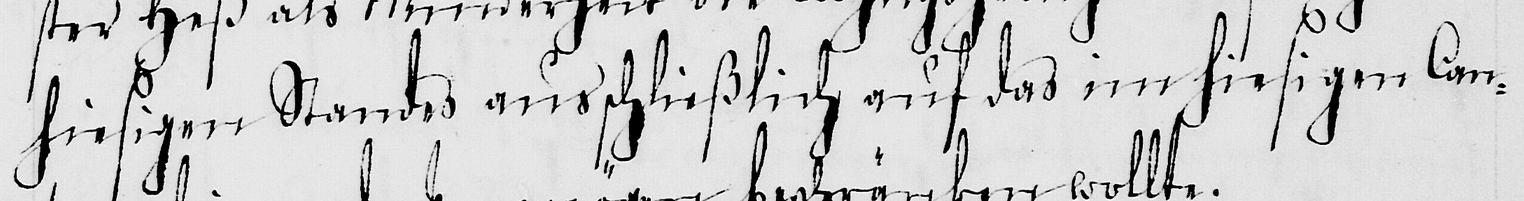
hiesigen Standes ausschließlich auf das im hiesigen Can¬
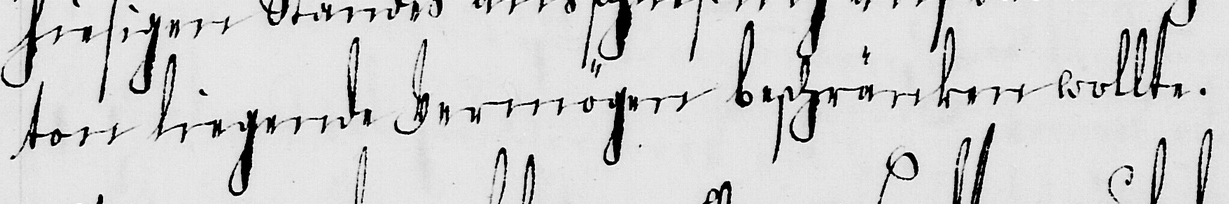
ton liegende Vermögen beschränken wollte.
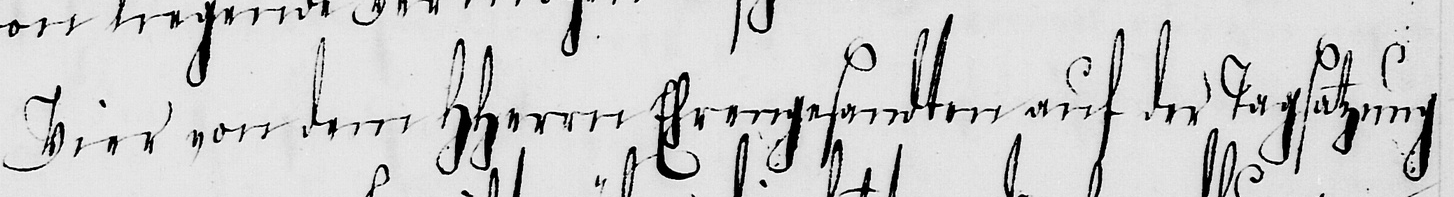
Vier von dem HHerrn Ehrengesandten auf der Tagsatzung
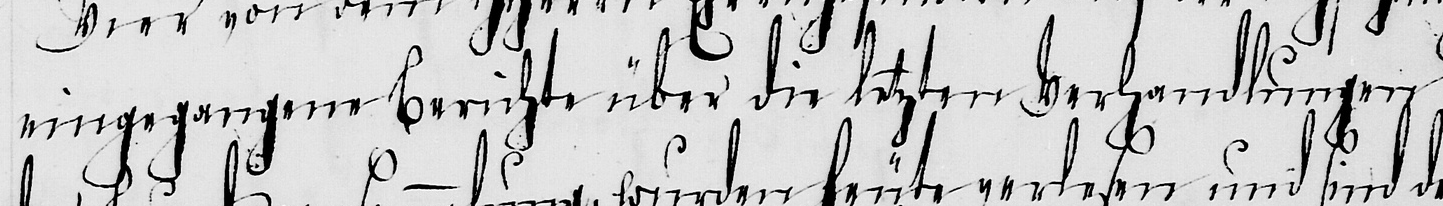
eingegangene Berichte über die letzten Verhandlungen
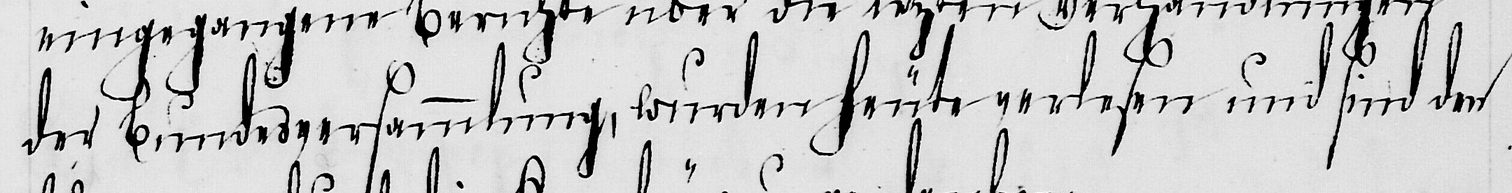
der Bundesversammlung, wurden heute verlesen und sind den
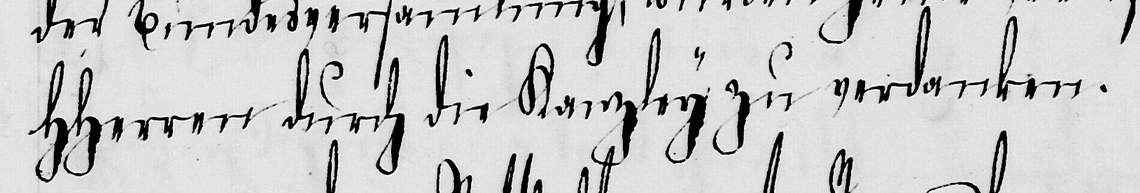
HHerren durch die Kanzley zu verdanken.
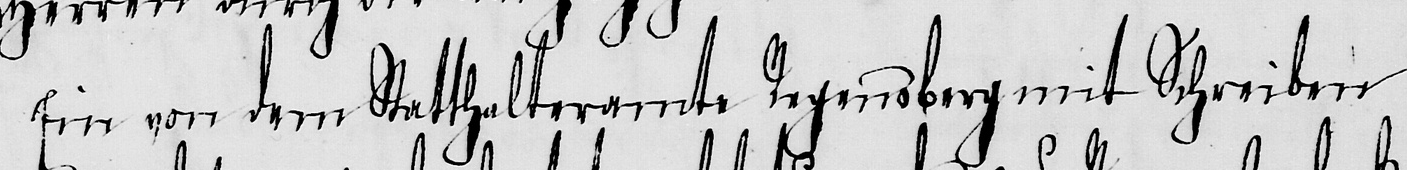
Ein von dem Statthalteramte Regensberg mit Schreiben
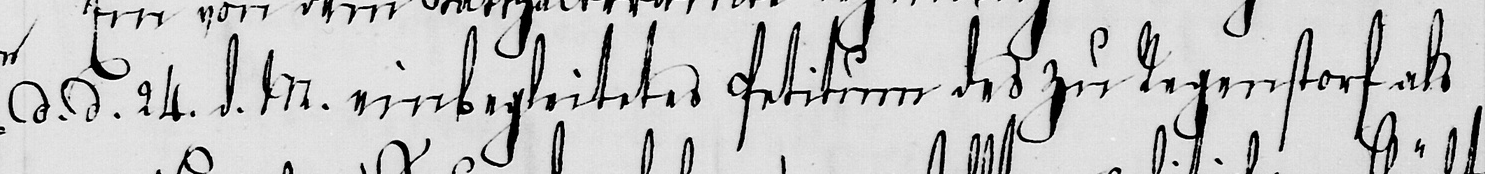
d. 24. d. M. einbegleitetes Petitum des zu Regenstorf als
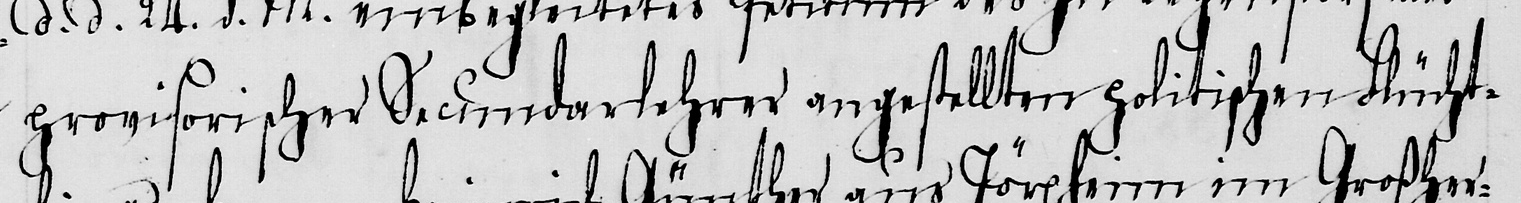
provisorischer Secundarlehrer angestellten politischen Flücht¬
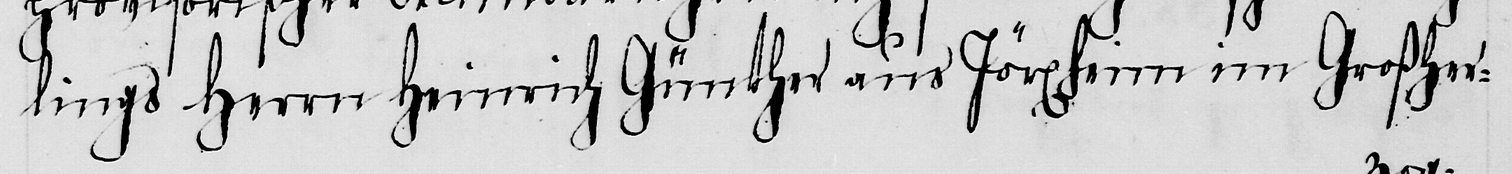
lings Herrn Heinrich Günther aus Jörxheim im Großher-
